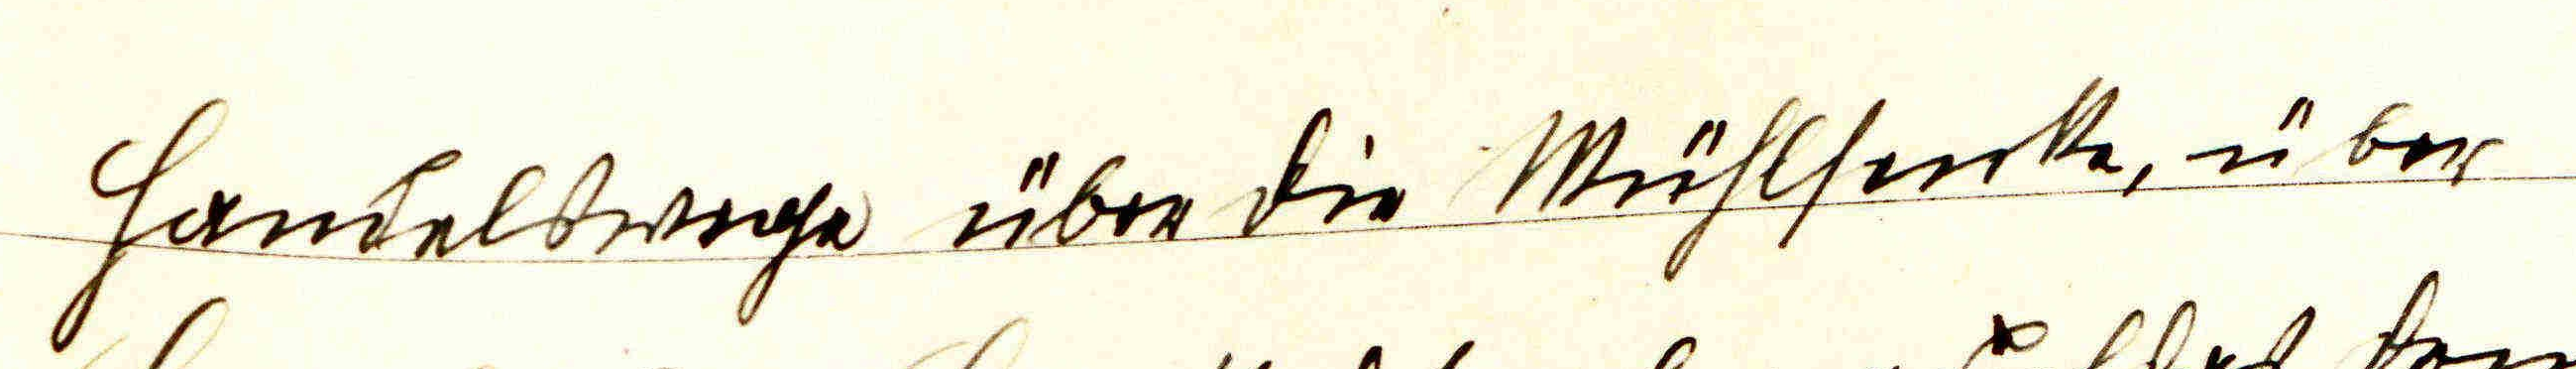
Handelswege über die Mühlsenke über
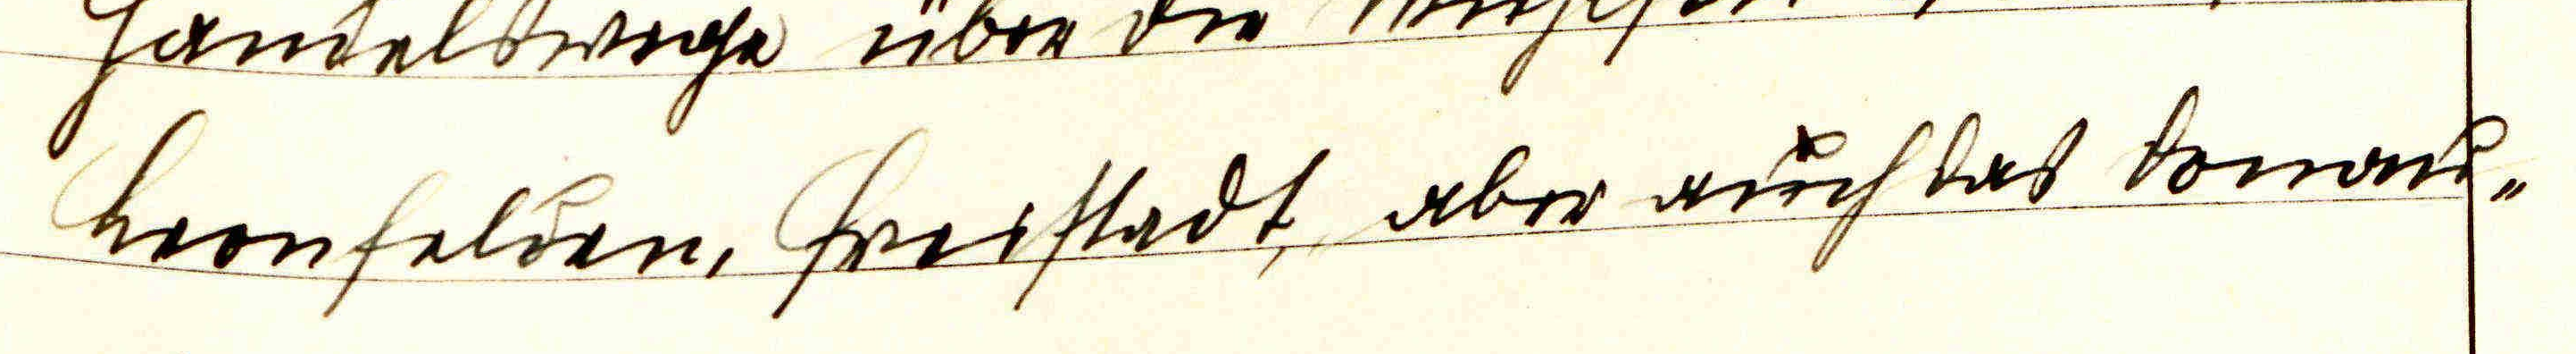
Leonfelden, Freistadt, aber auch das Donau-
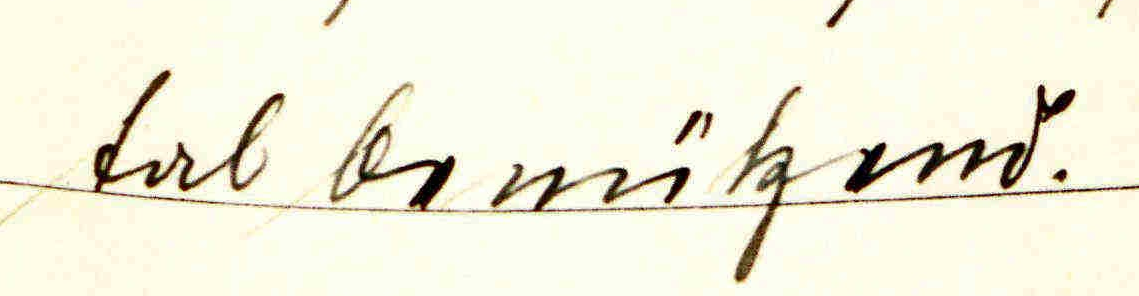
tal benützend.
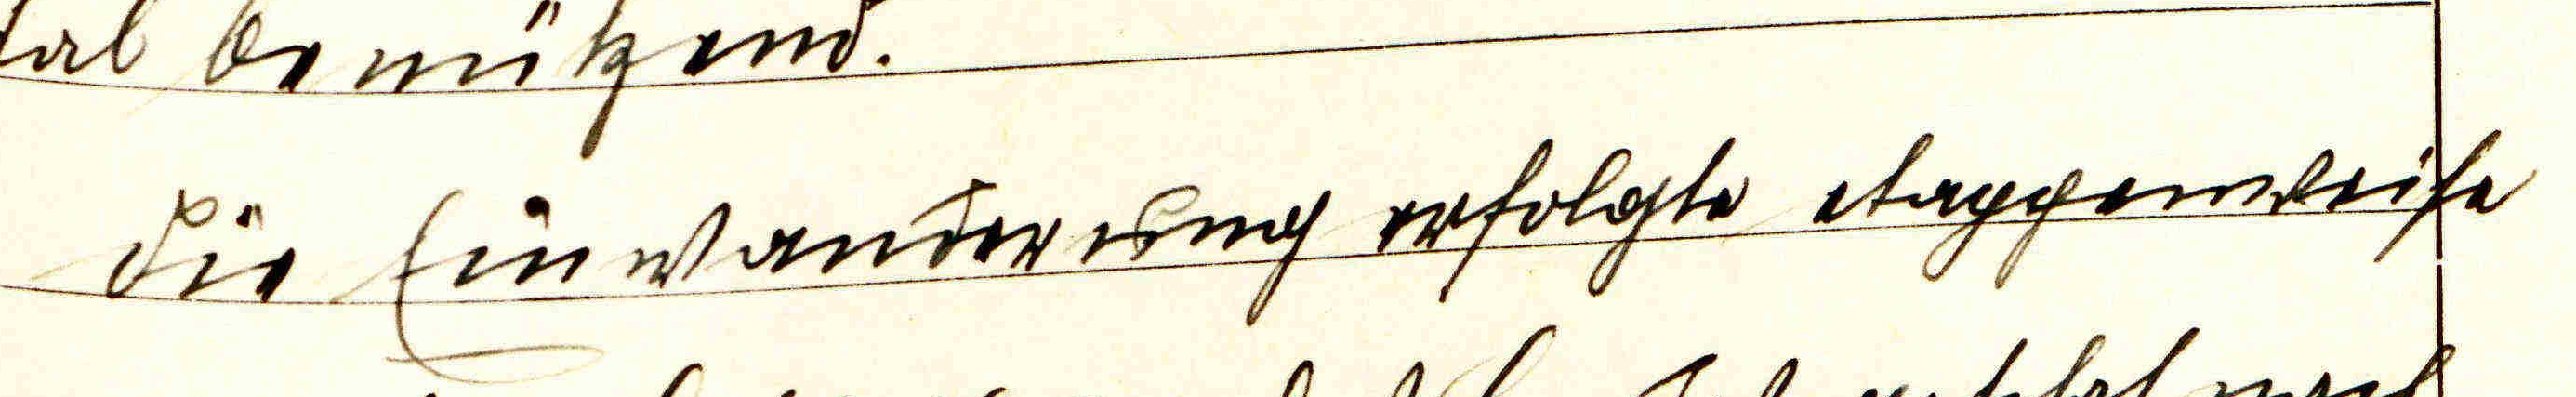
Die Einwanderung erfolgte etappenweise
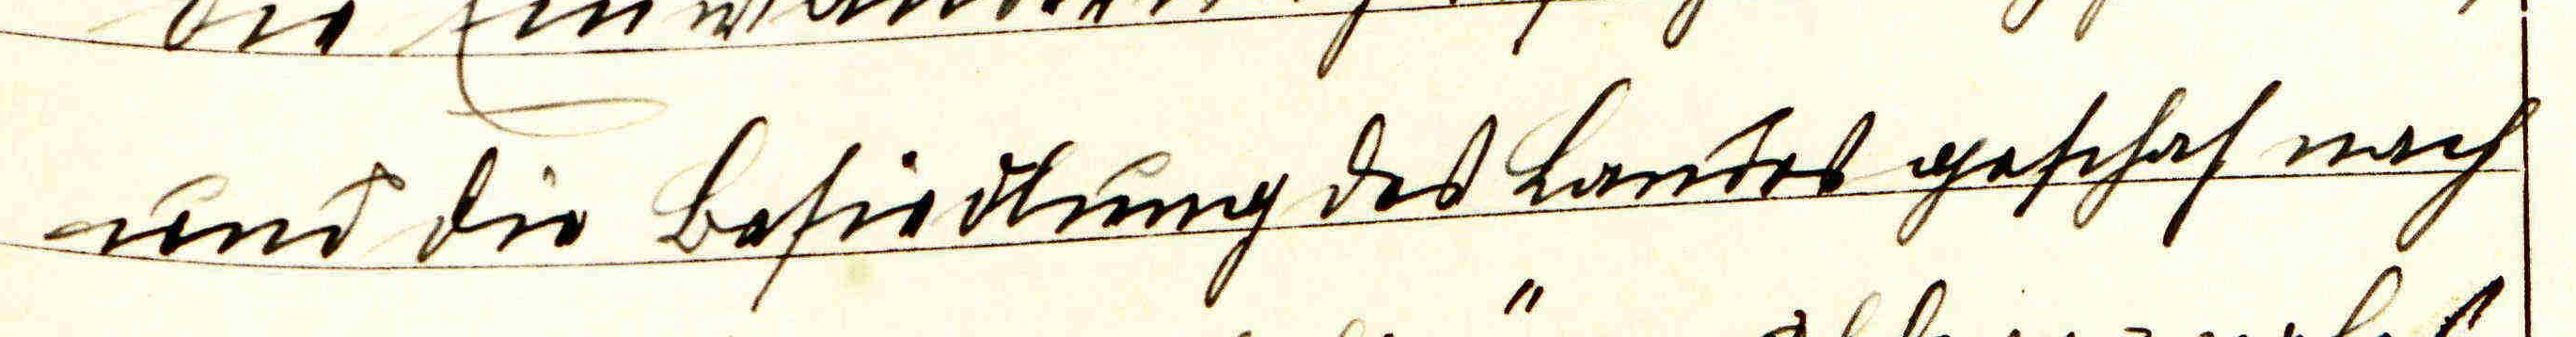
und die Besiedlung des Landes geschah nach
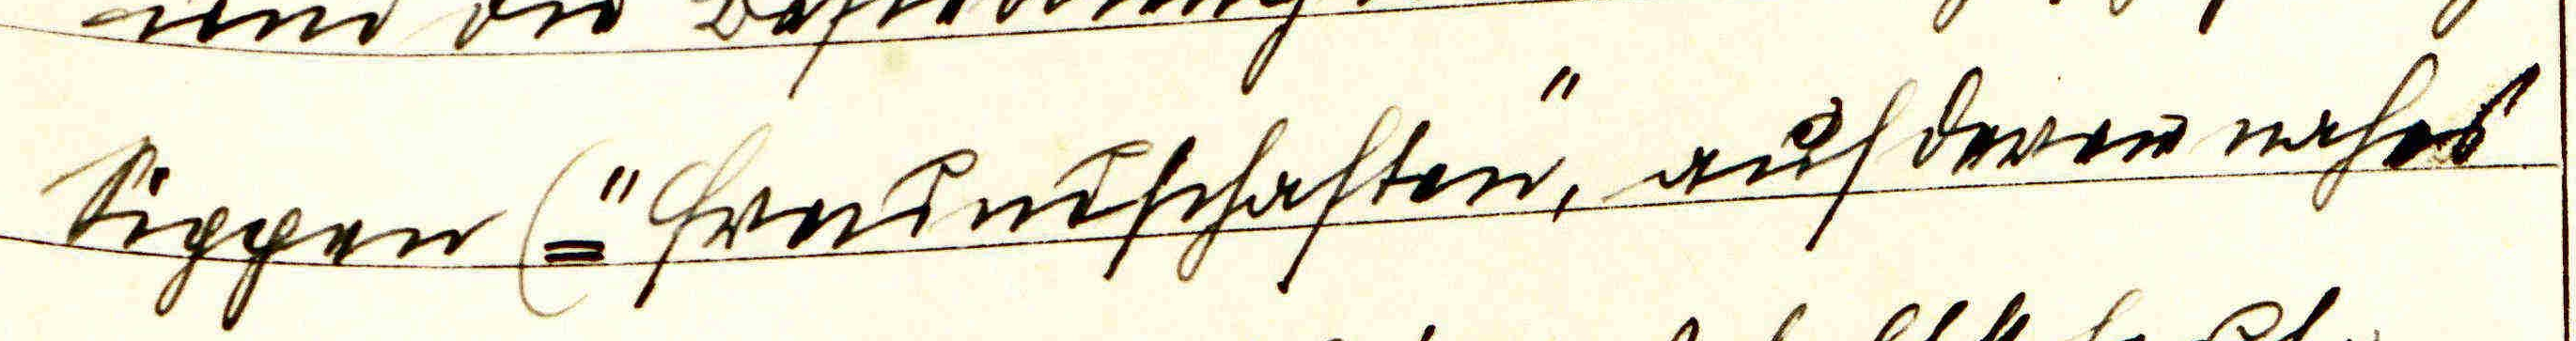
Sippen (=“Freundschaften“, auf deren nahes
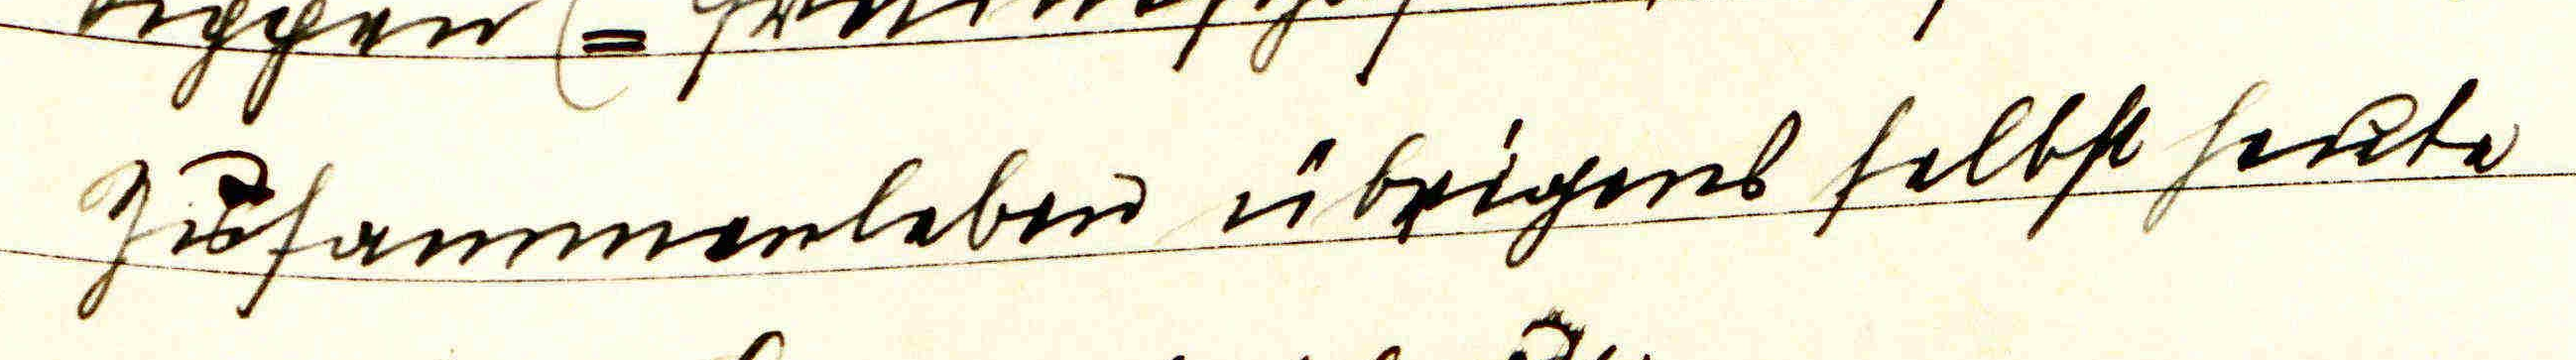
Zusammenleben übrigens selbst heute
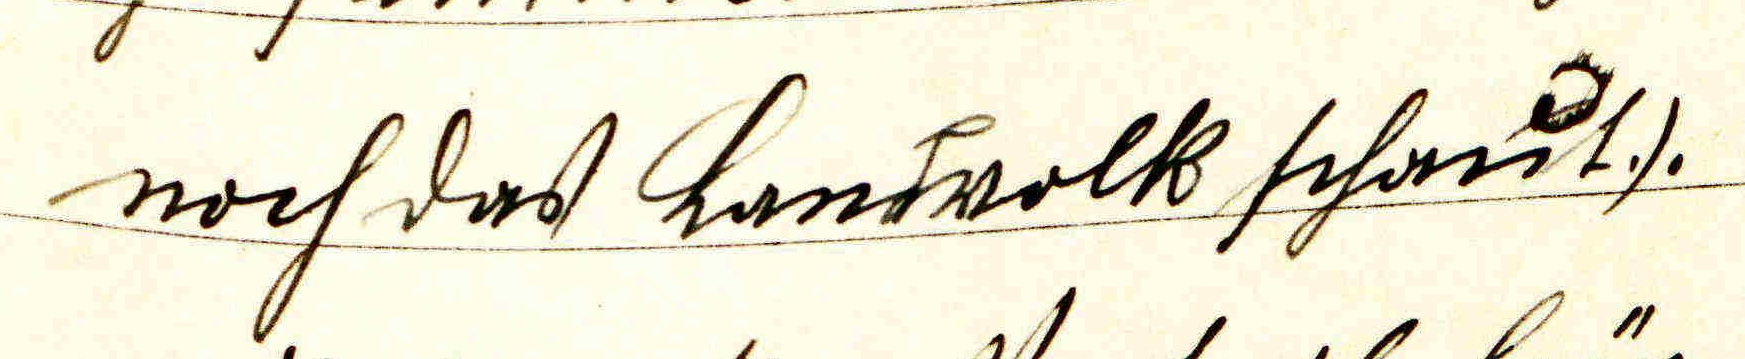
noch das Landvolk schaut.)
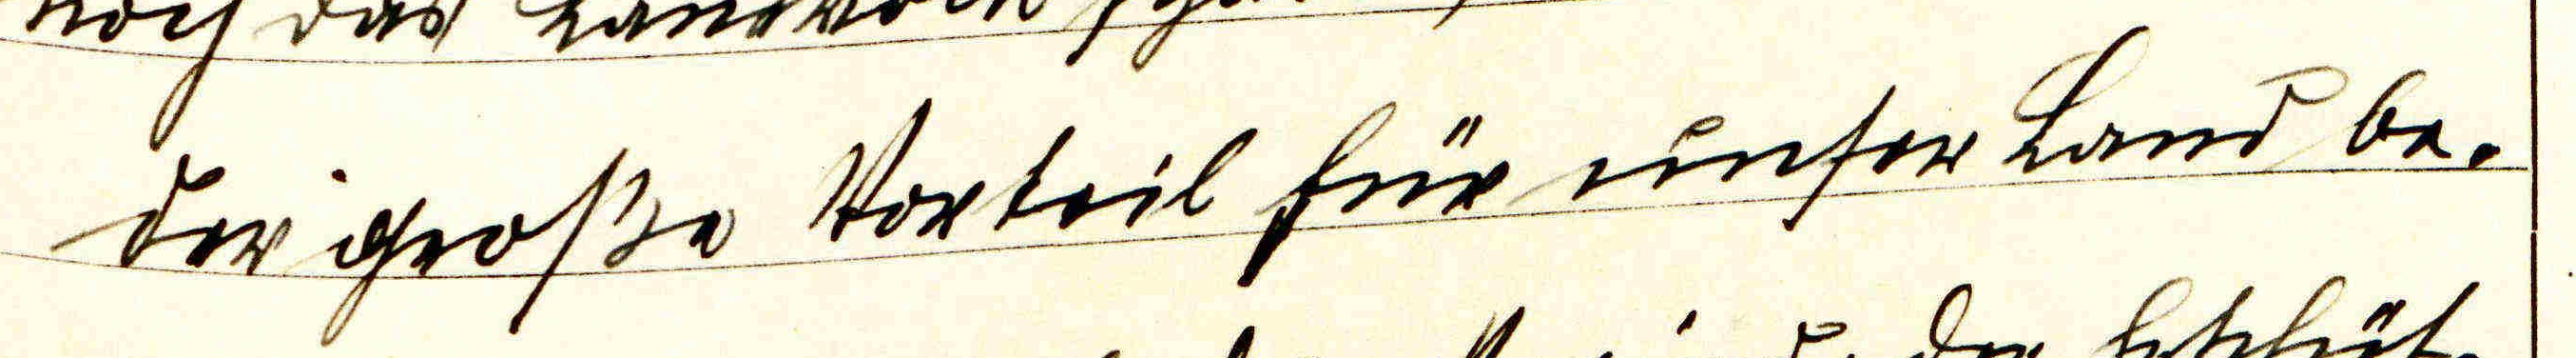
Der große Vorteil für unser Land be-
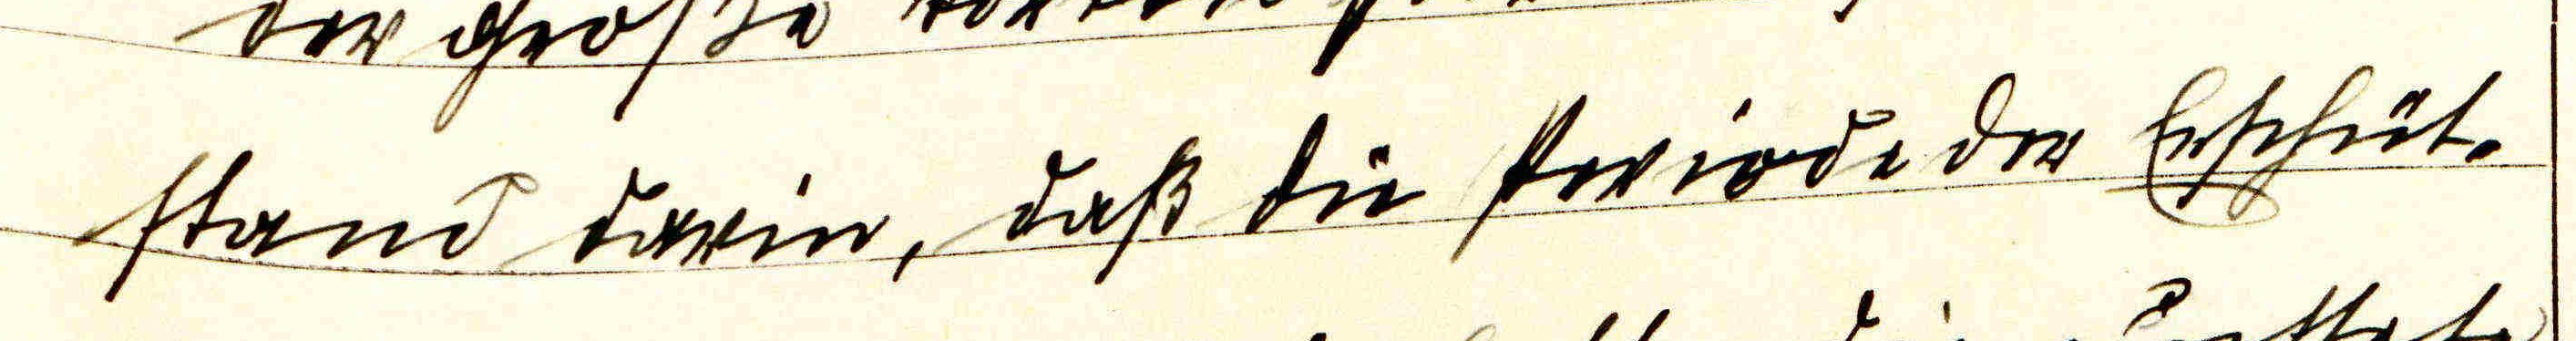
stand darin, daß die Periode der Erschüt-
